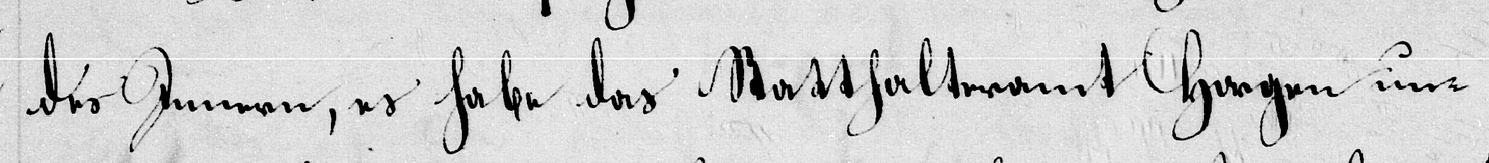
des Innern, es habe das Statthalteramt Horgen un¬
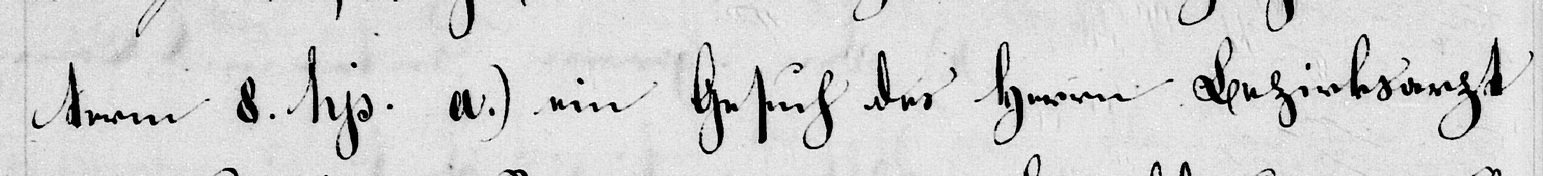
term 8. hjs. a.) ein Gesuch des Herrn Bezirksarzt
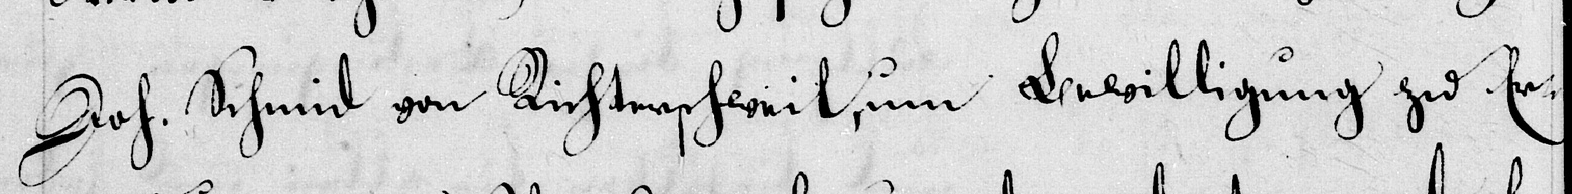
Joh. Schmid von Richterschweil, um Bewilligung zu Er¬
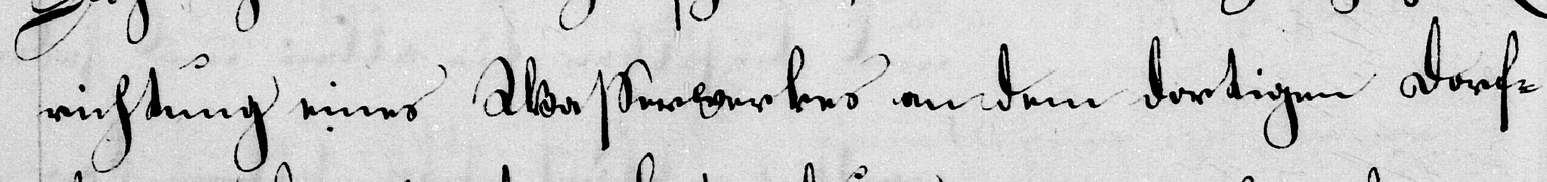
richtung eines Waßerwerkes an dem dortigen Dorf¬
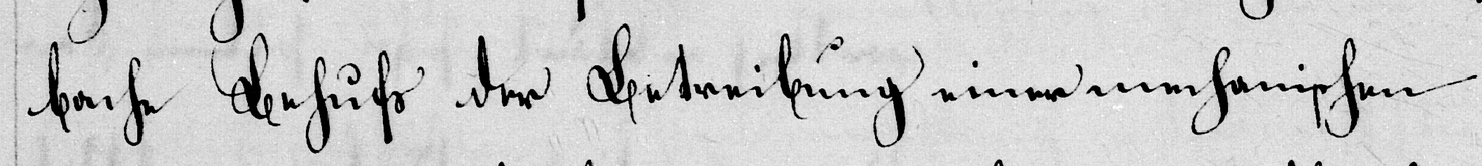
bache Behufs der Betreibung einer mechanischen
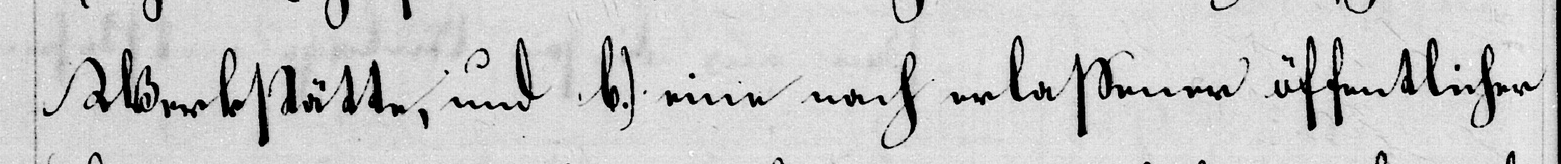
Werkstätte, und b.) eine nach erlaßener öffentlicher
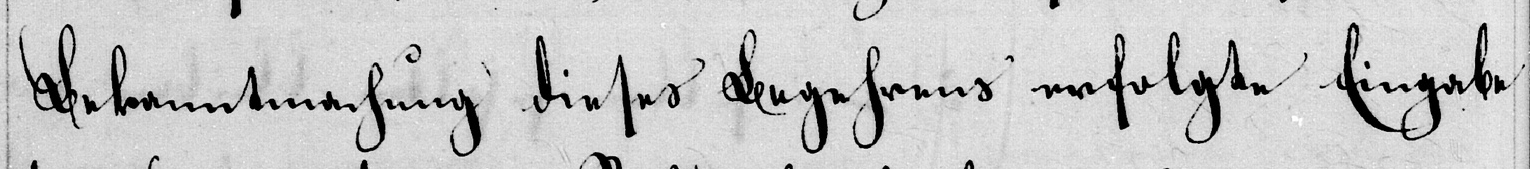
Bekanntmachung dieses Begehrens erfolgte Eingabe
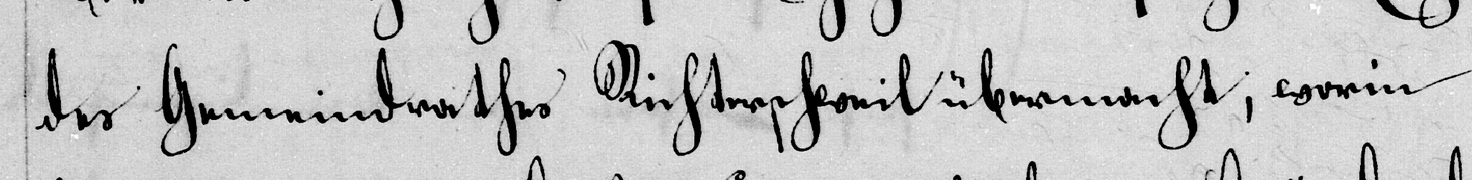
des Gemeindrathes Richterschweil übermacht, worin
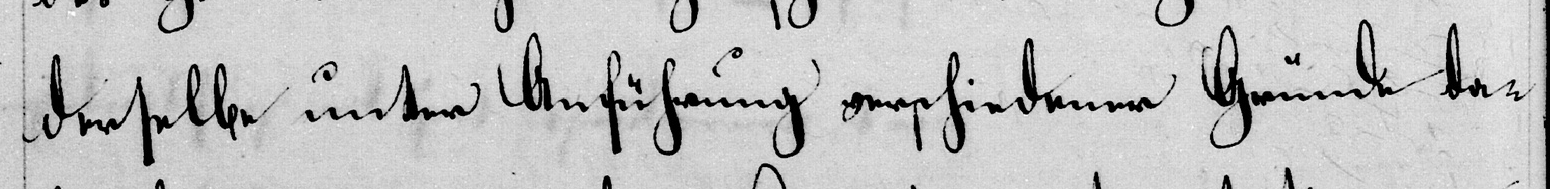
derselbe unter Anführung verschiedener Gründe da¬
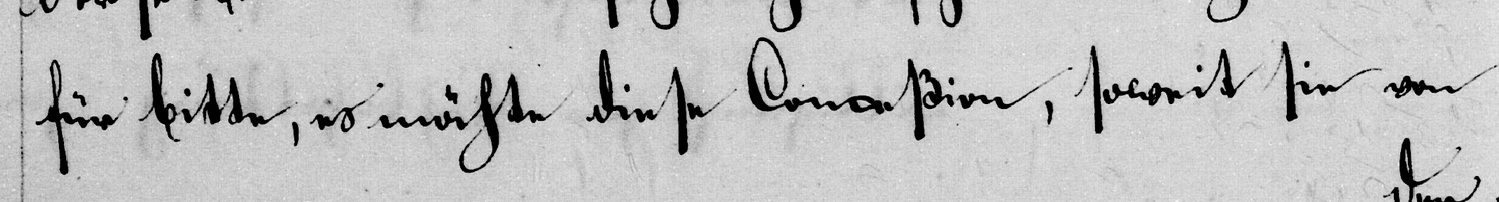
für bitte, es möchte diese Conceßion, soweit sie von
